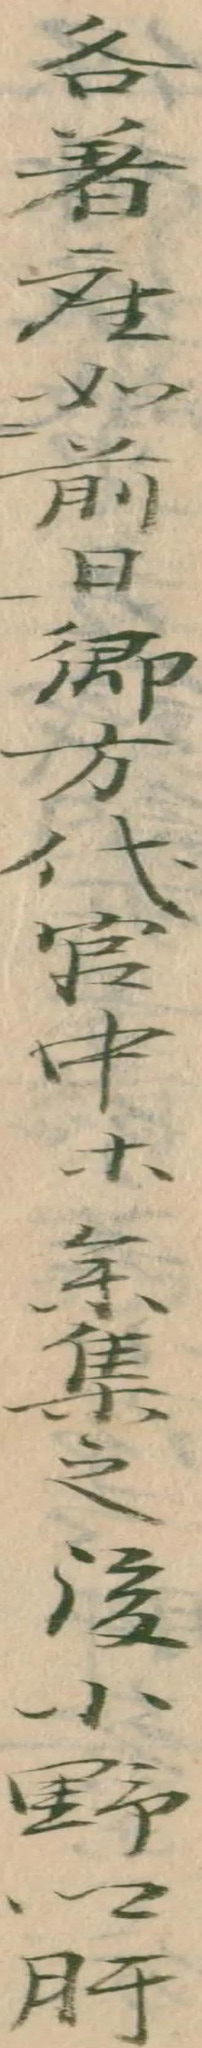各着座如前日郷方代官中等参集之後小野郷肝
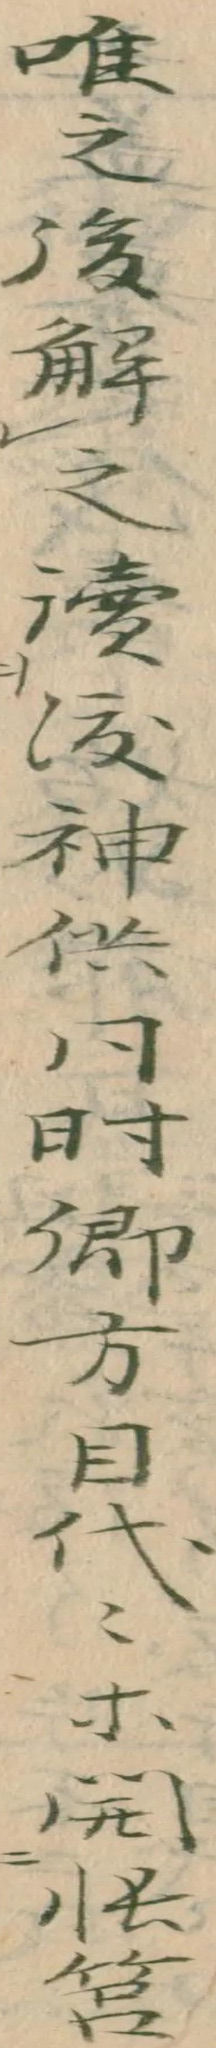唯之後解之読-渡神供同時郷方目代々等開帳筥

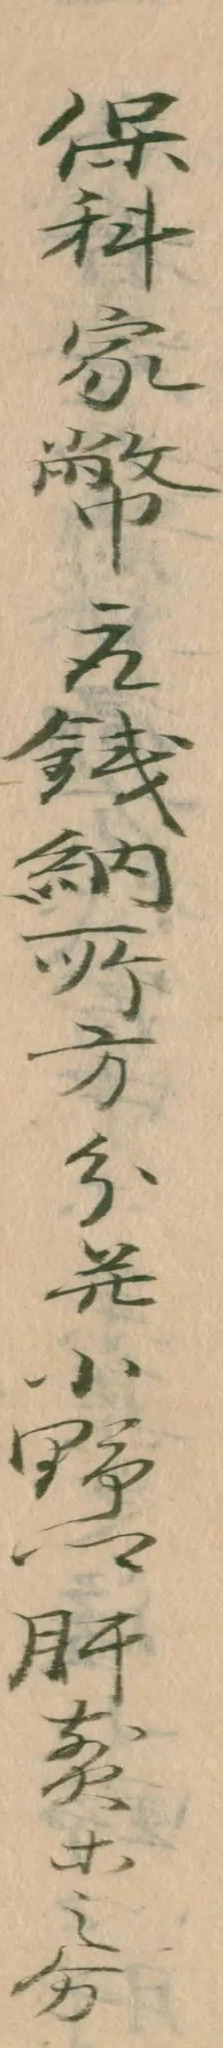一保科家幣取銭納所方分并小野郷肝煎等之分
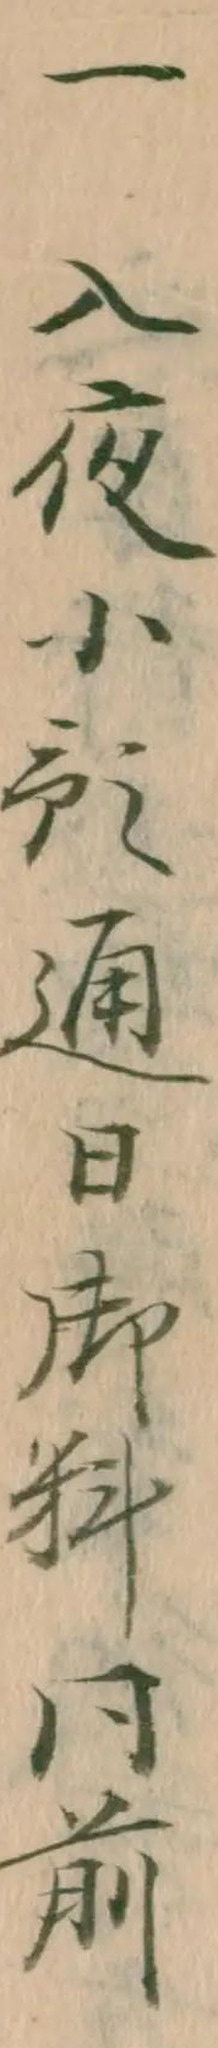一入夜小預通日御料同前
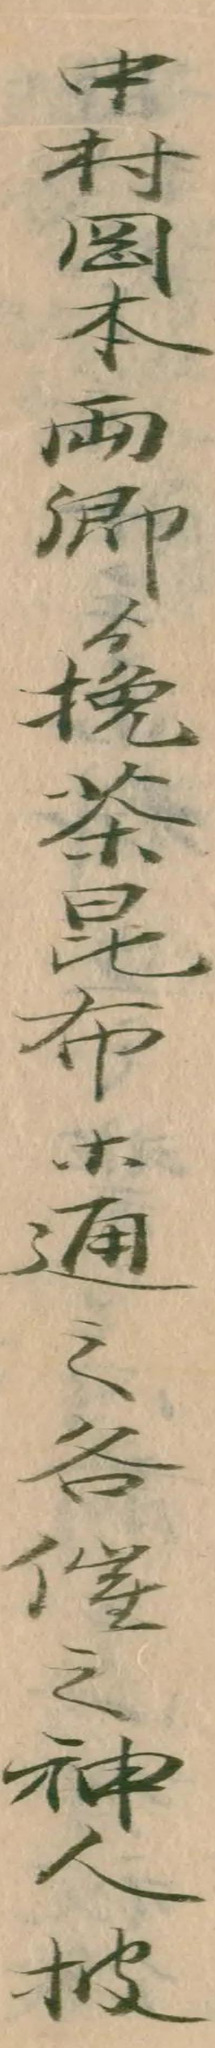中村岡本両郷ゟ挽茶昆布等通之各催之神人披
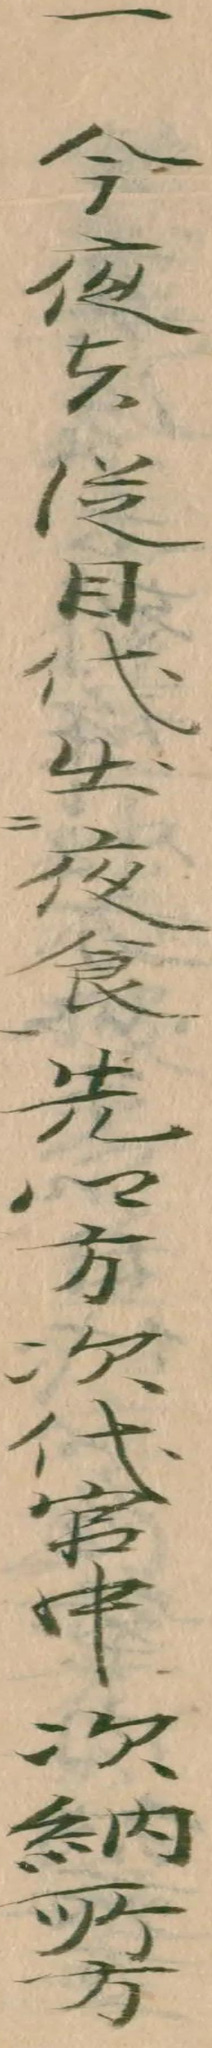一今夜は従目代出夜食先郷方次代官中次納所方
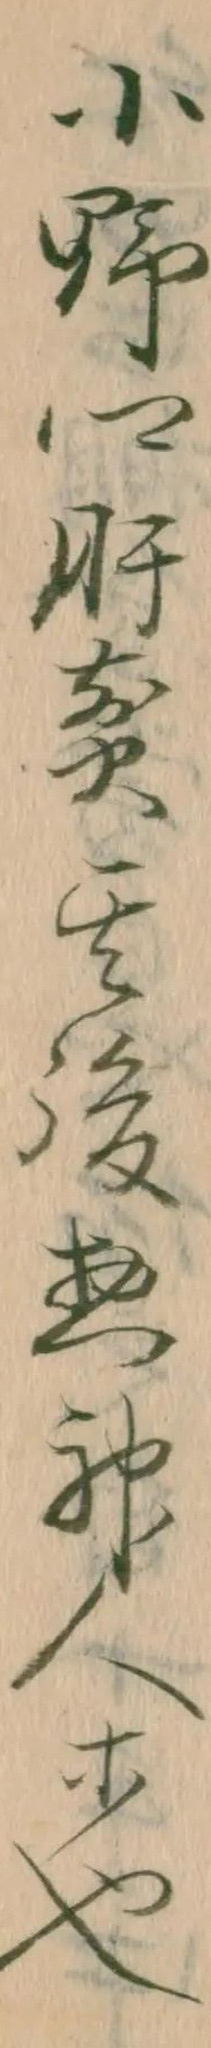小野郷肝煎其後惣神人等也
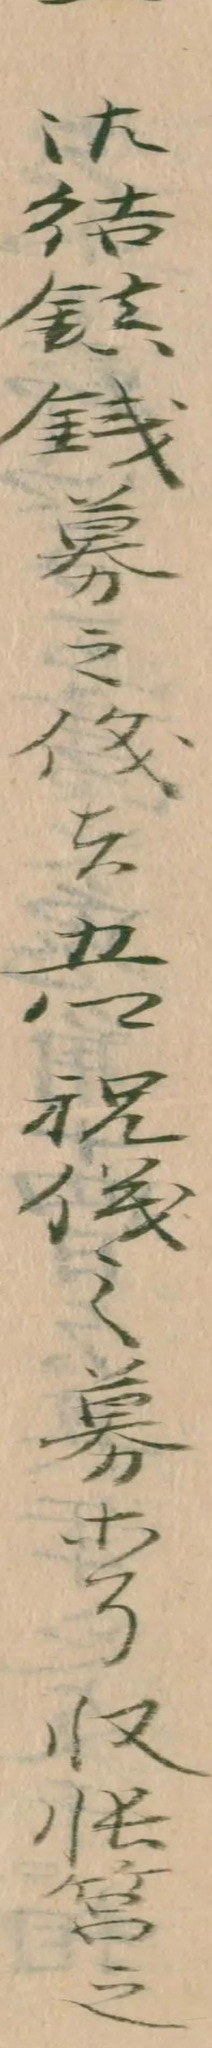一御結鎮銭募之儀は五郷祝儀之募等了収帳筥之
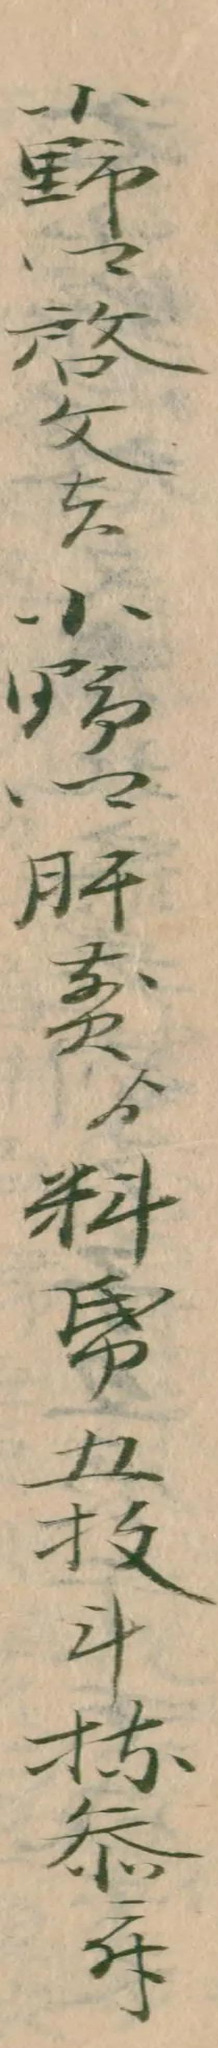一小野郷啓文は小野郷肝煎ゟ料紙五枚計持参ニ付
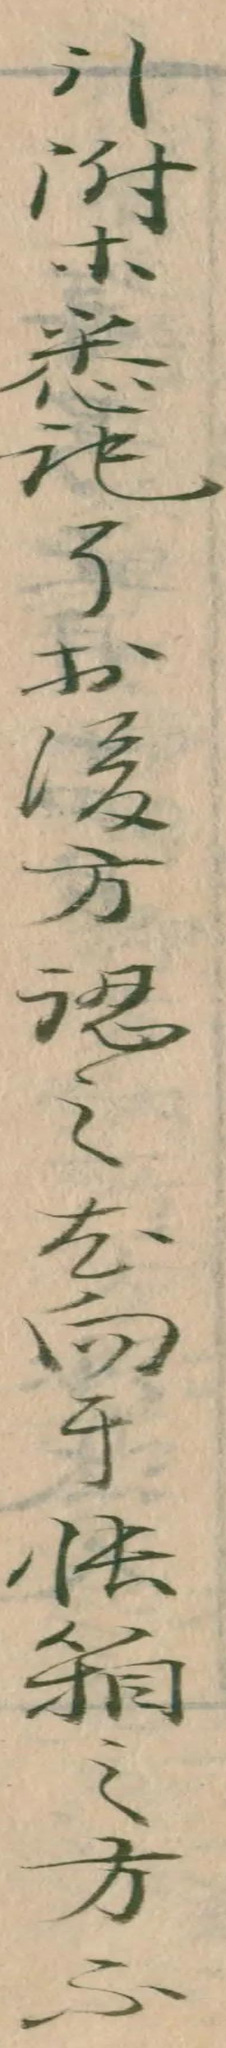引附等悉記了於後方認之尤向于帳箱之方不
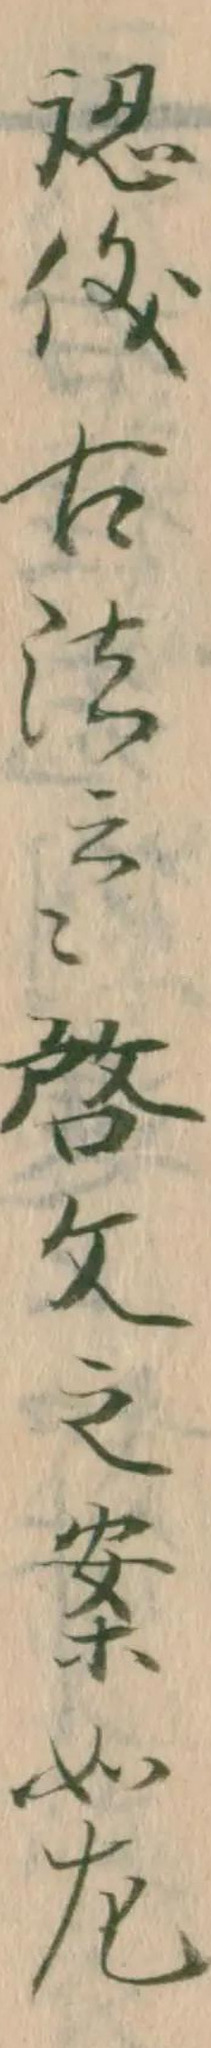認儀古法云々啓文之案如左
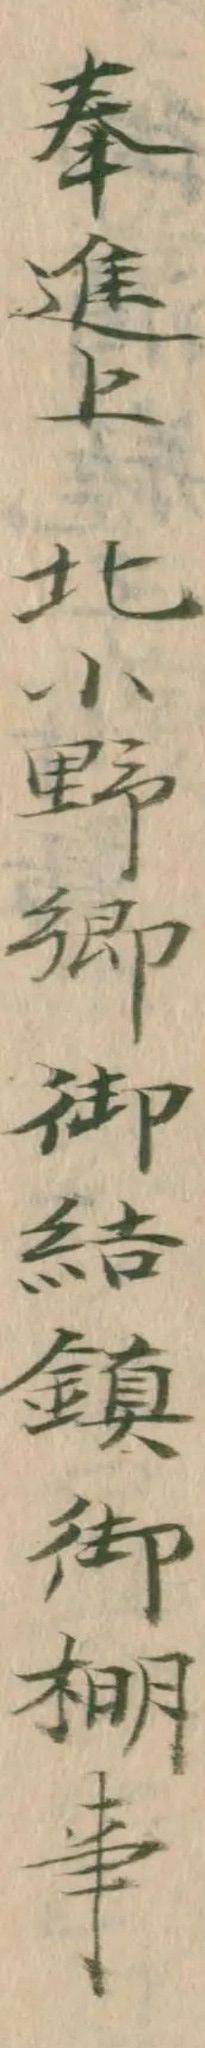奉進上北小野郷御結鎮御棚事
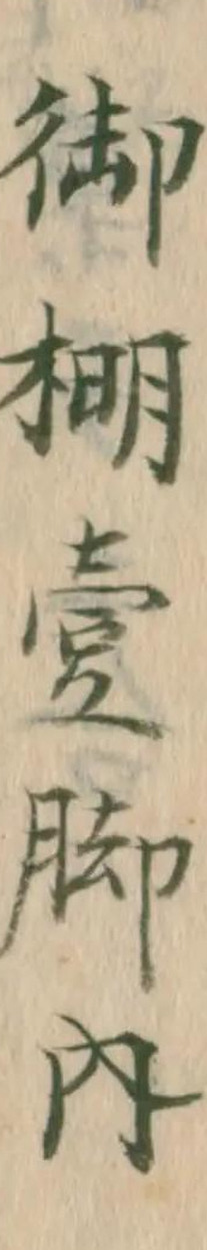御棚壱脚内
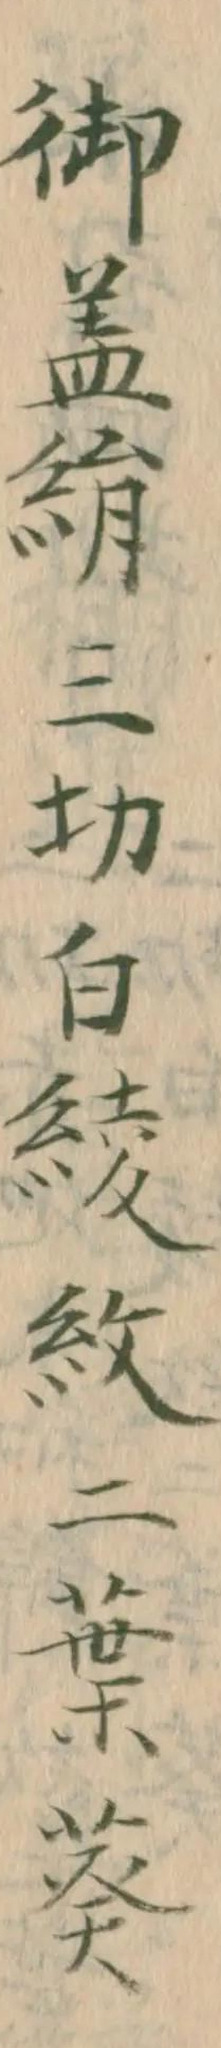御盖絹三切白綾紋二葉蒸

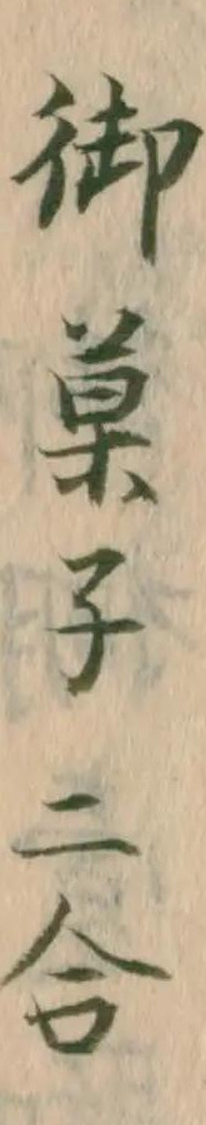御菓子二合
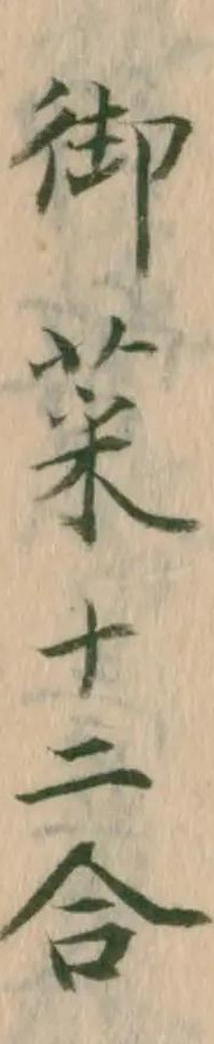御菜十二合
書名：賀茂社記録. 第26冊
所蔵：国立国会図書館 National Diet Library, JAPAN
